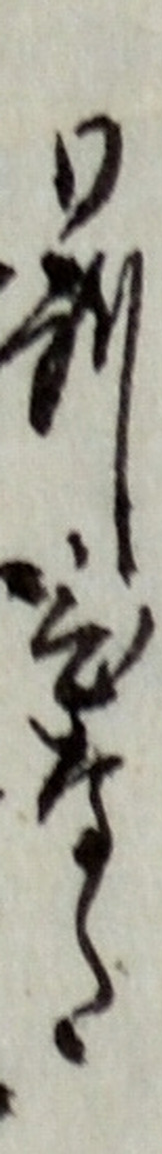同所ひなた
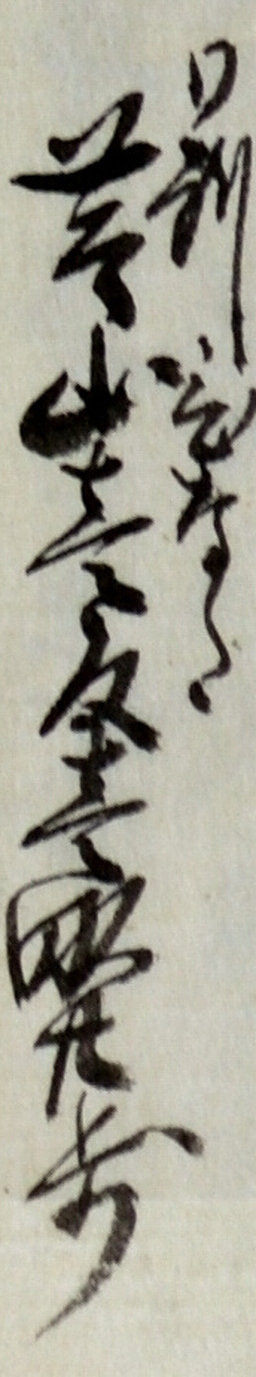芝山壱反壱畝廿歩同断
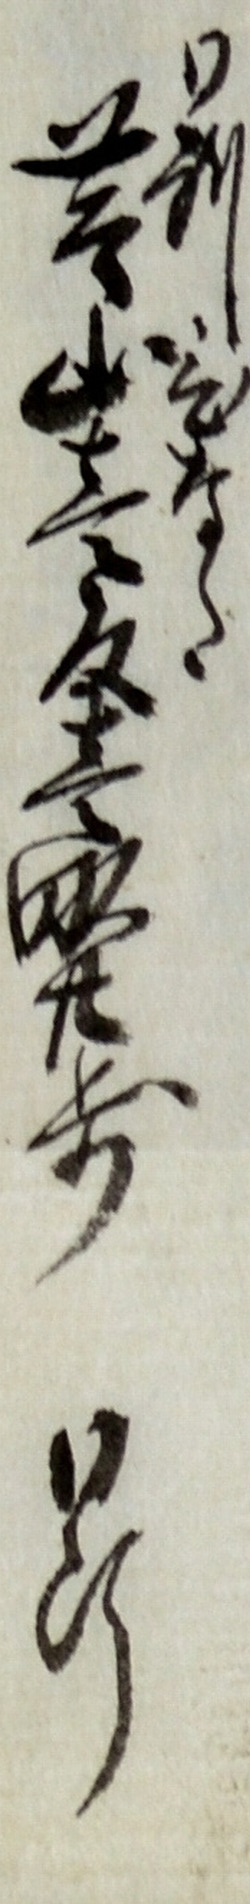芝山壱反壱畝廿歩同断

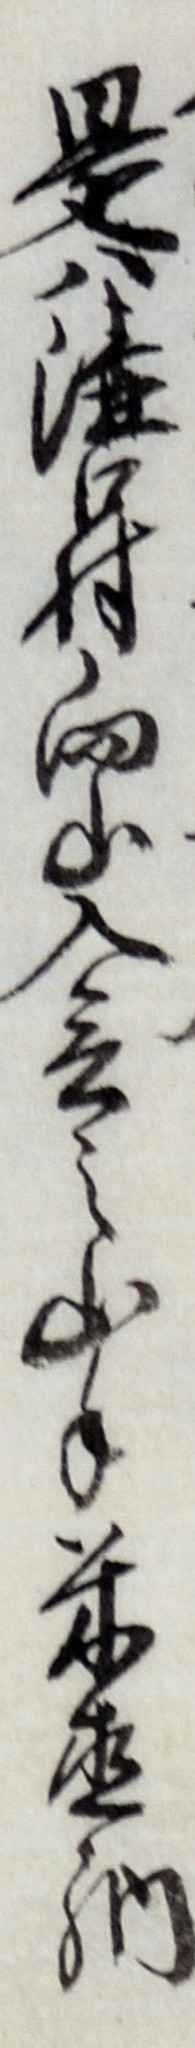是ハ溝口村向山入会之山手米直納
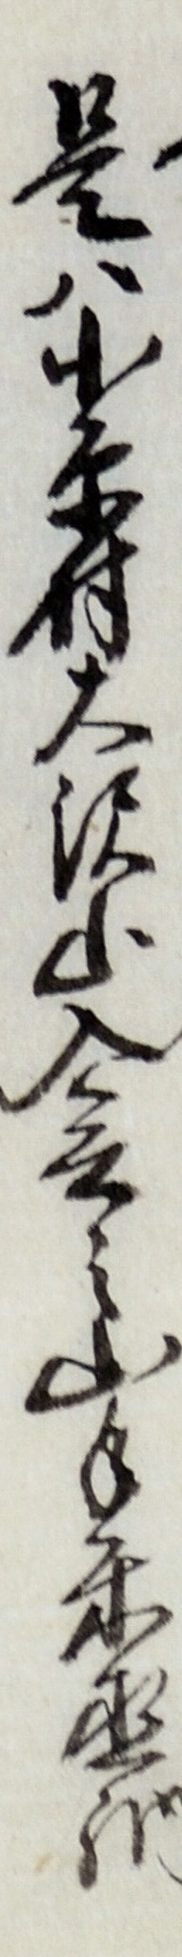是ハ小原村大沢山入会之山手米直納
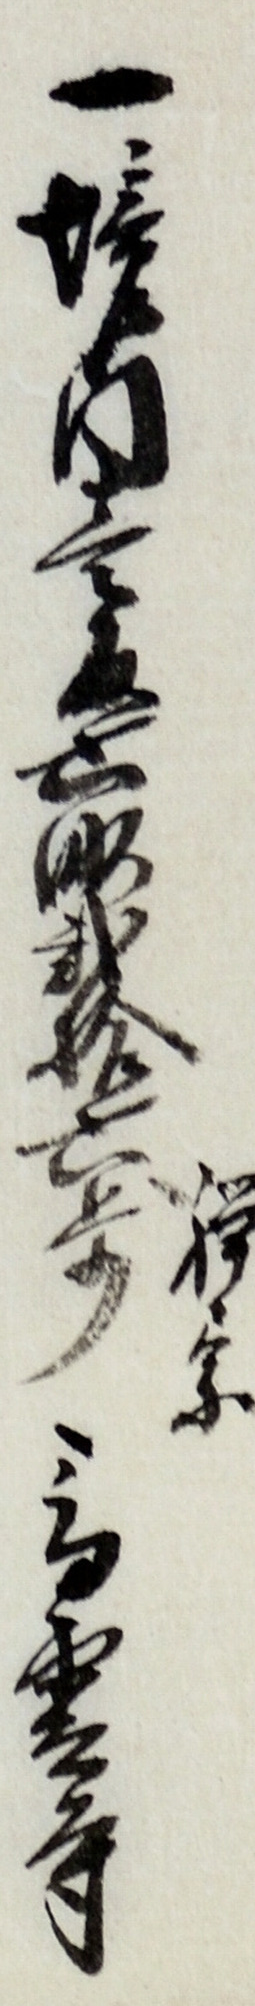一境内壱反六畝弐拾六歩高雲寺
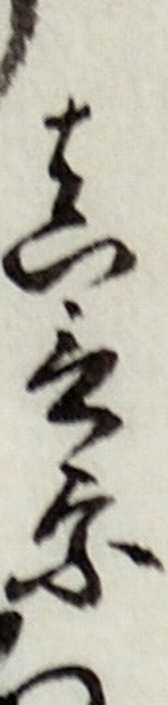真言宗
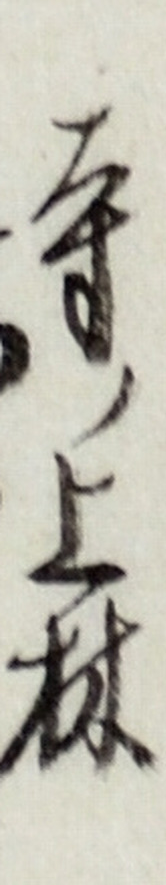寺ノ上林
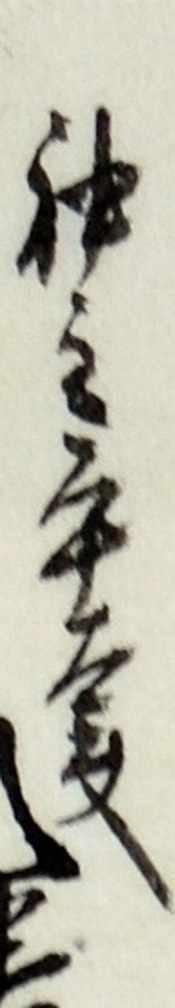神主平太夫
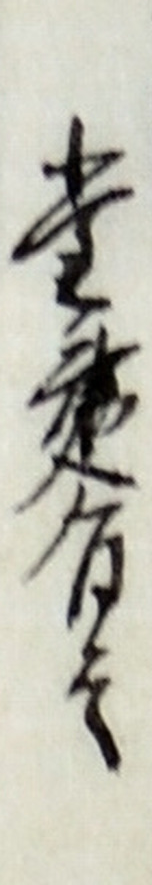堂建有之
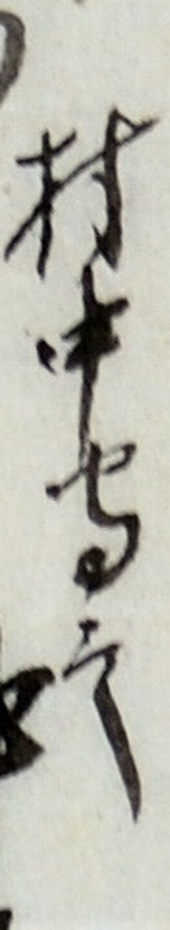村中守之
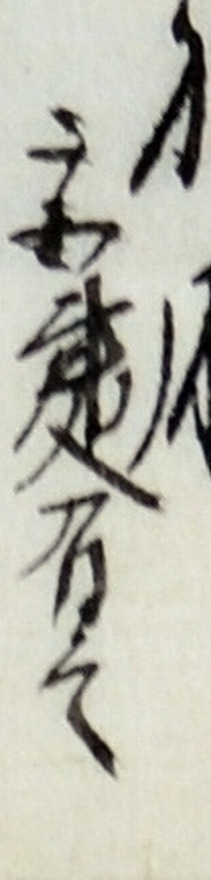宮建有之
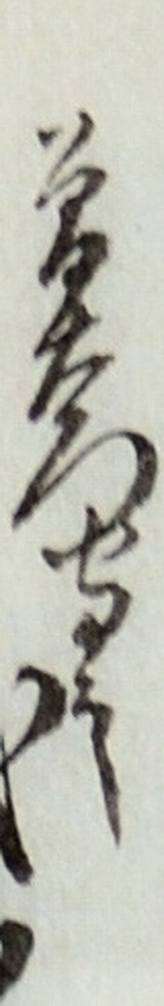曽右衛門守之
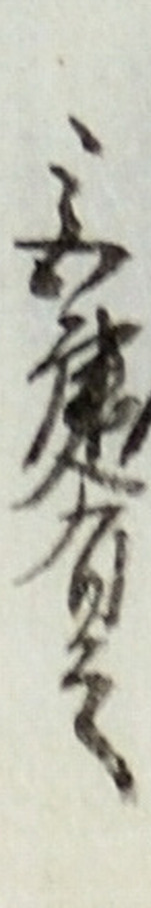宮建有之
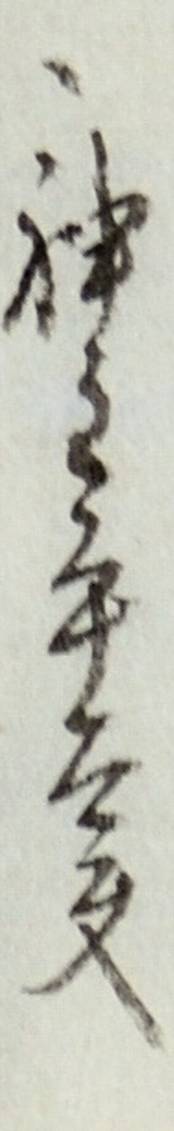神主平太夫
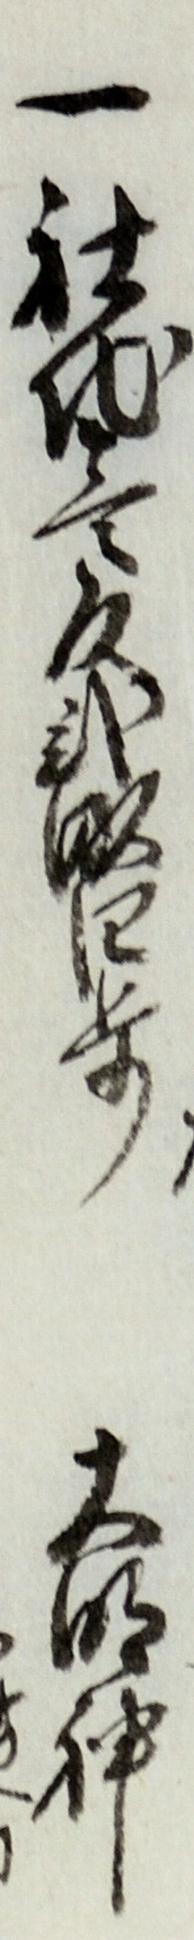一社地壱反弐畝四歩大明神
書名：御領分中山林社地手控
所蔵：伊那市立高遠町図書館・合同会社AMANE
